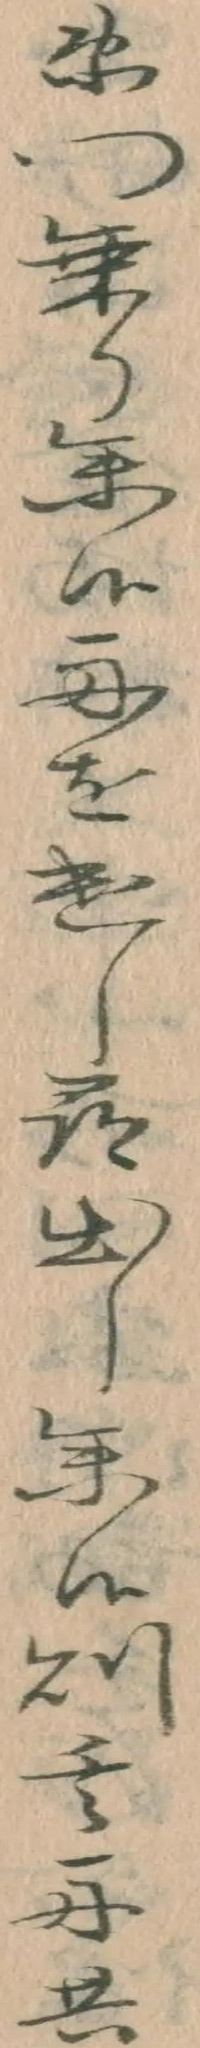衛門乗り参候舟を遣し尋出し参候則其舟共
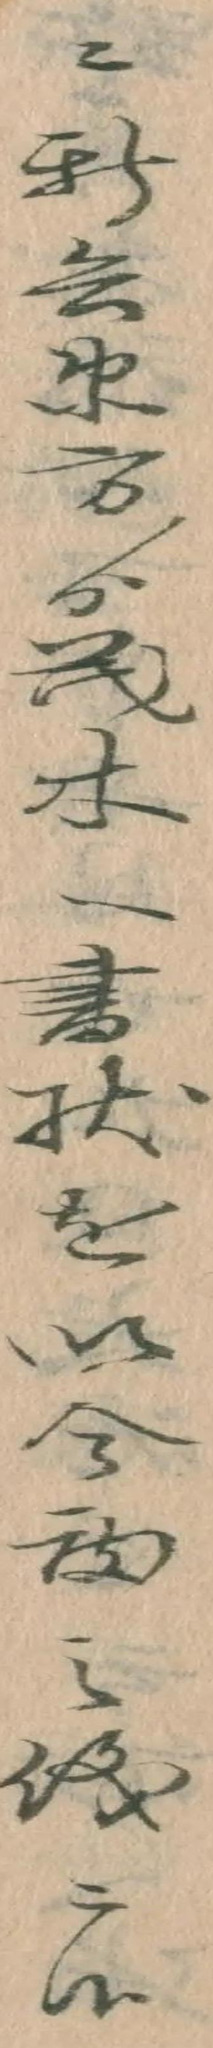に新兵衛方ゟ茂木へ書状を以今度之儀に候
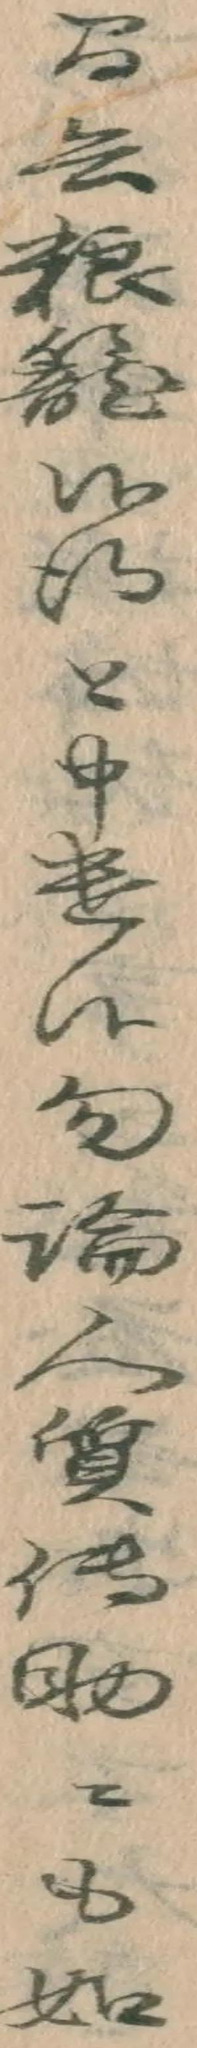間兵粮籠候得と申遣候勿論人質伝助にも如
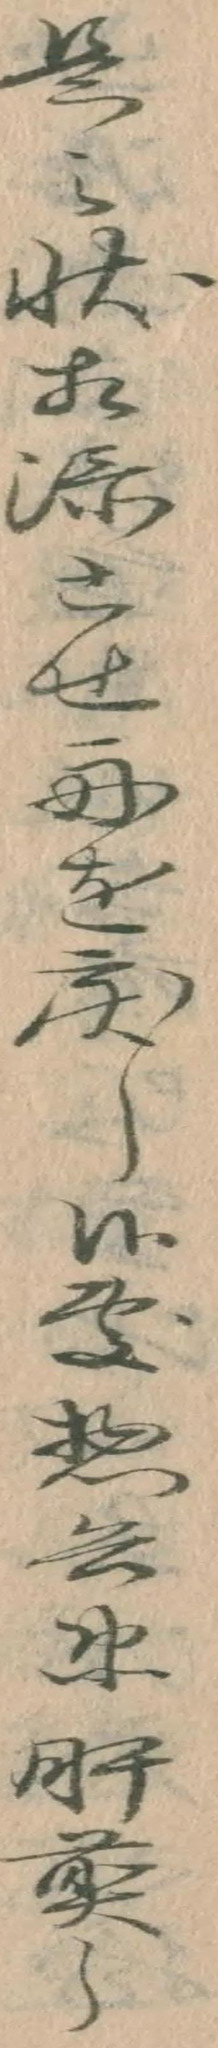是之状相添させ舟を戻し候処惣兵衛肝煎し
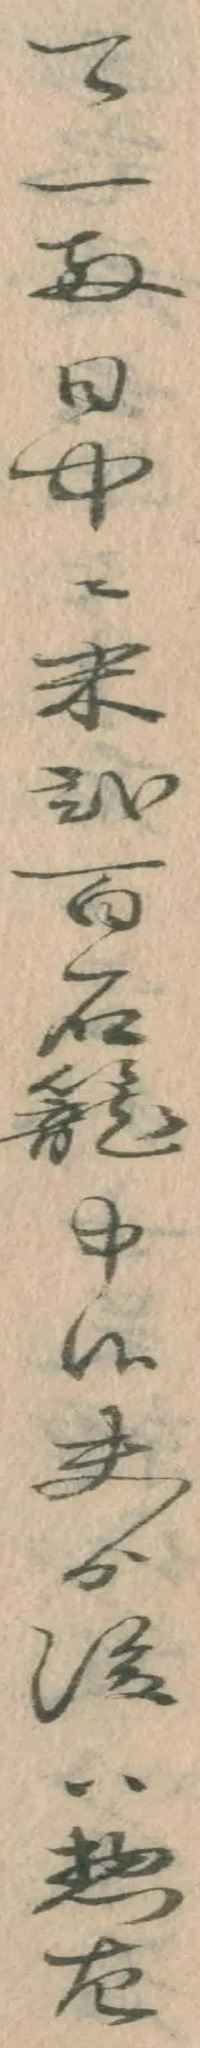て一両日中に米弐百石籠申候夫ゟ後は惣左
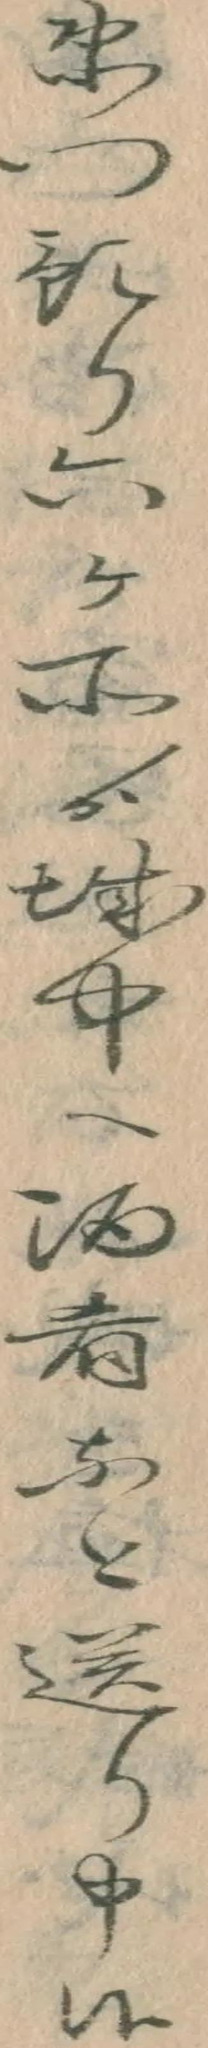衛門預り六け所ゟ城中へ酒肴なと送り申候
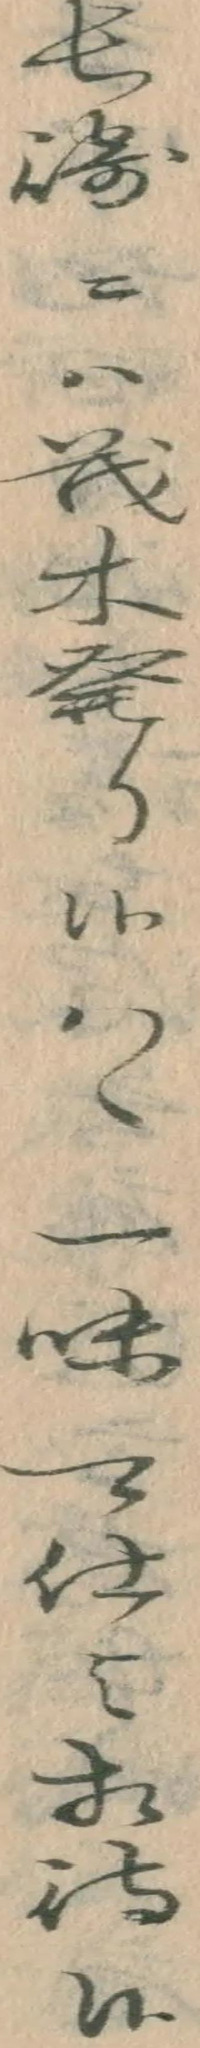長崎には茂木発り候はゝ一味可仕与相待候
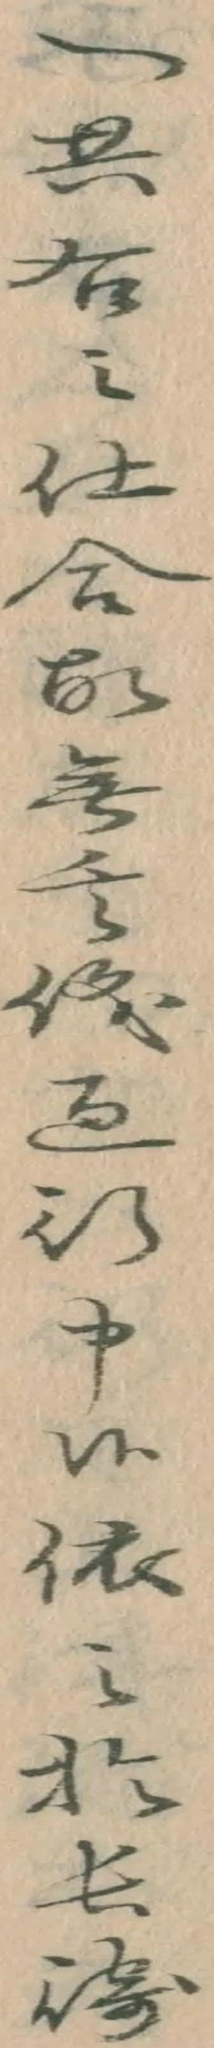へ共右之仕合故無其儀過行申候依之於長崎
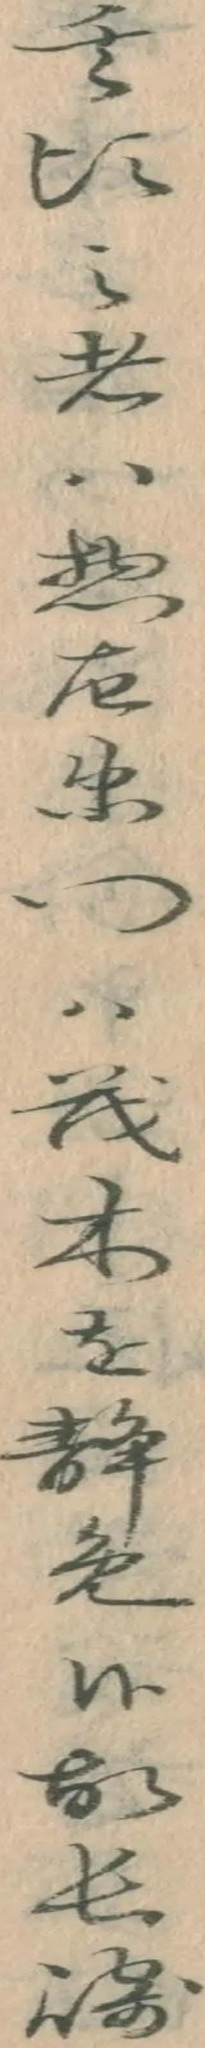其頃之者は惣左衛門は茂木を静免候故長崎

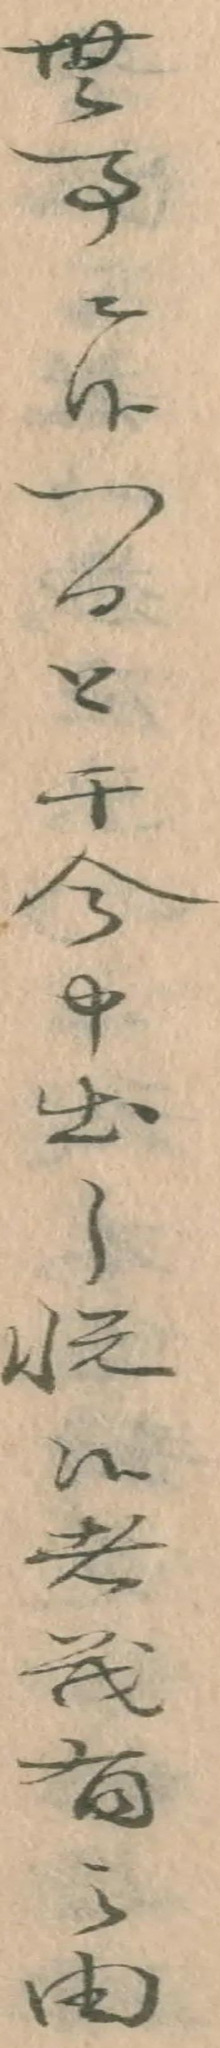無事に候へると干今申出し悦候者茂有之由
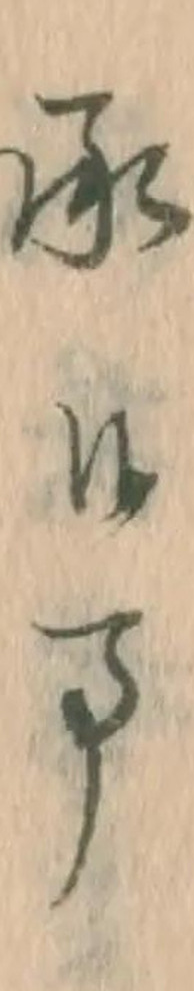承候事
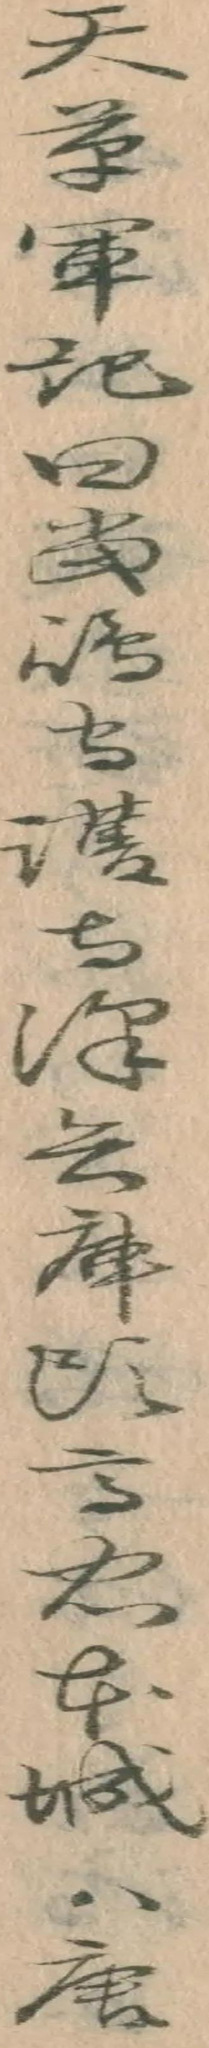天草軍記曰当島守護寺澤兵庫頭高忠本城は唐
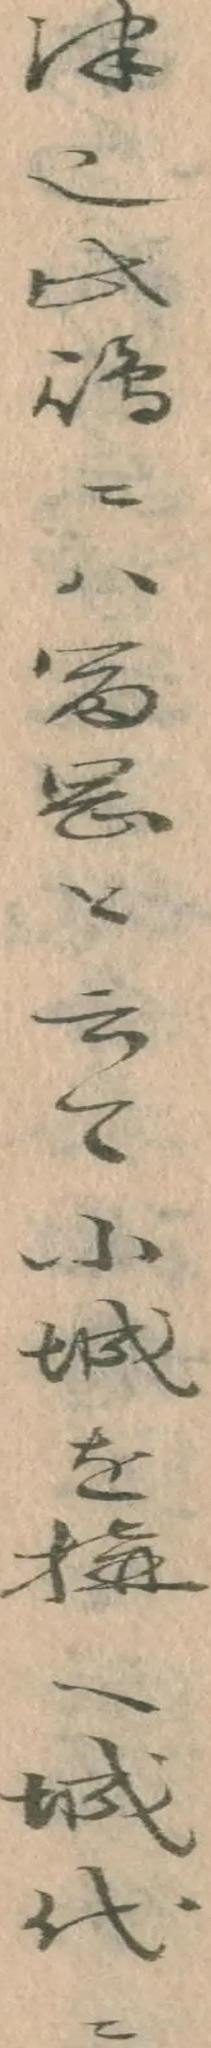津也此島には冨岡と云て小城を構へ城代に
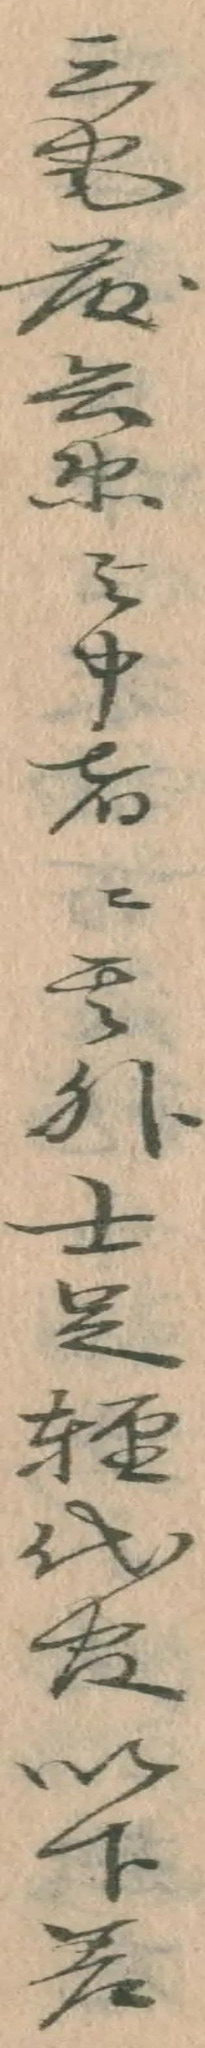三宅藤兵衛与申者に其外士足軽代官以下差
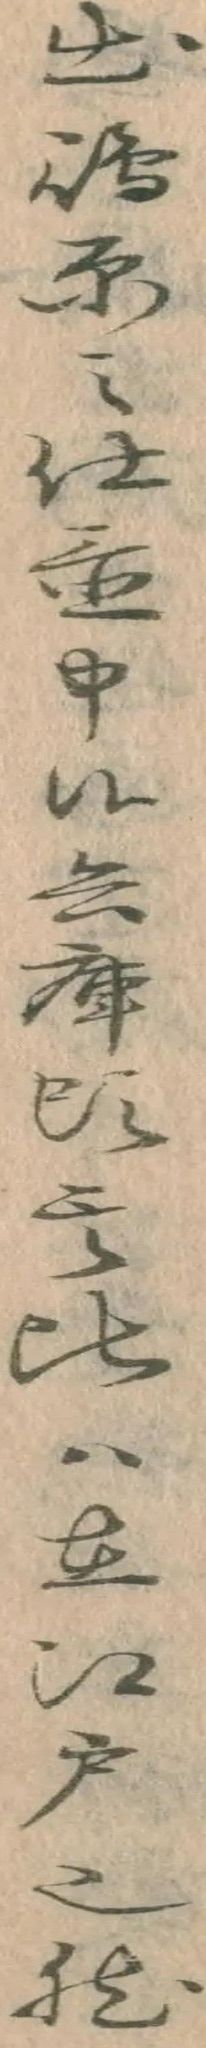出島原之仕置申候兵庫頭其頃は在江戸也然
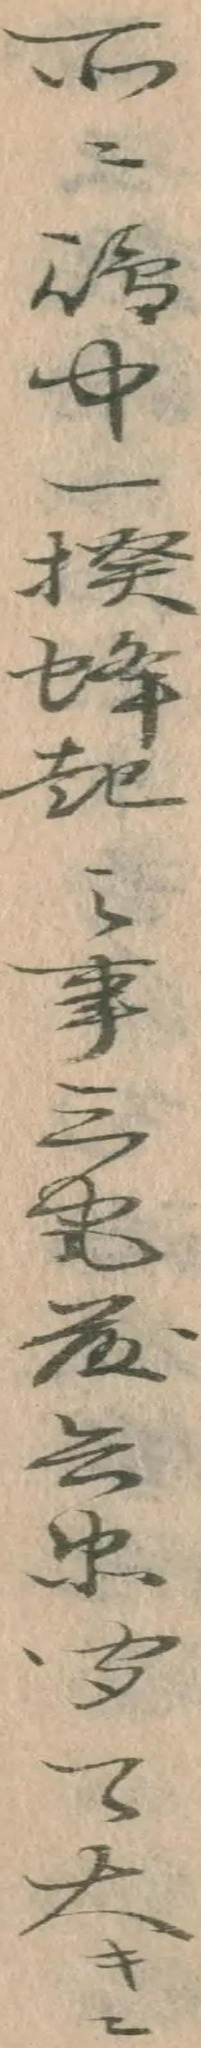所に島中一揆蜂起之事三宅藤兵衛聞て大きに
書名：切支丹御退治記 49巻. [2]
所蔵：国立国会図書館 National Diet Library, JAPAN
